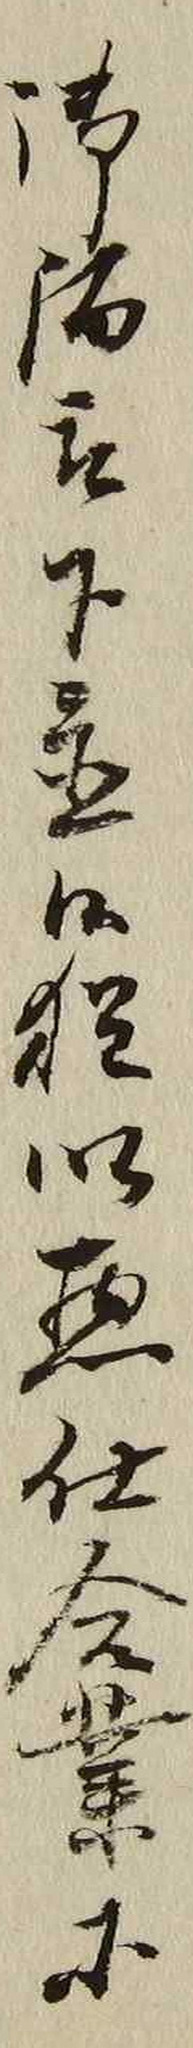御酒被下置候猶以惣仕合業等
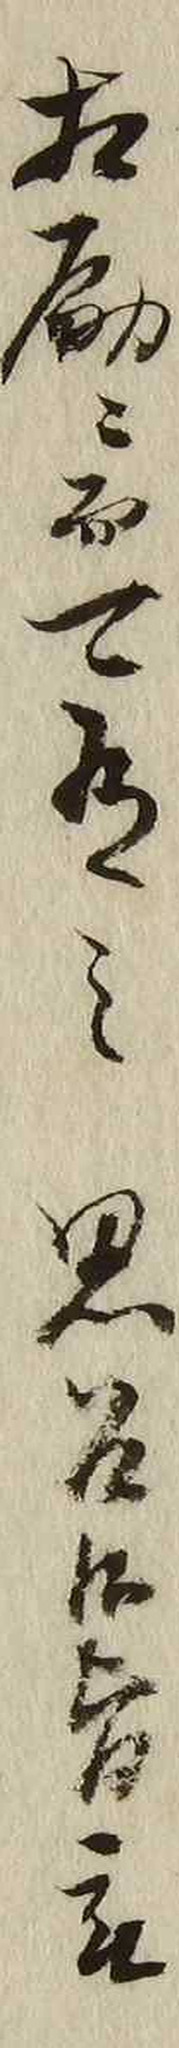相励ニ而可有之思召候旨被
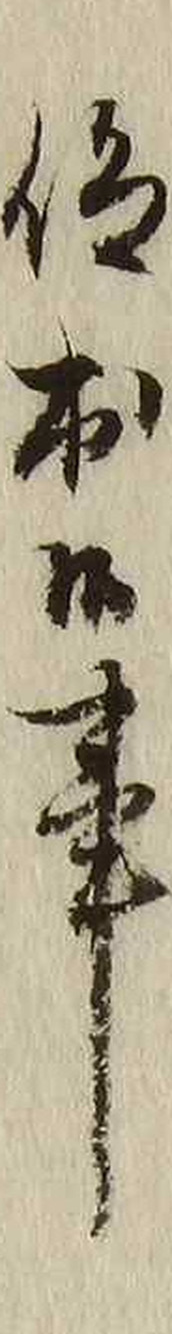仰出候事
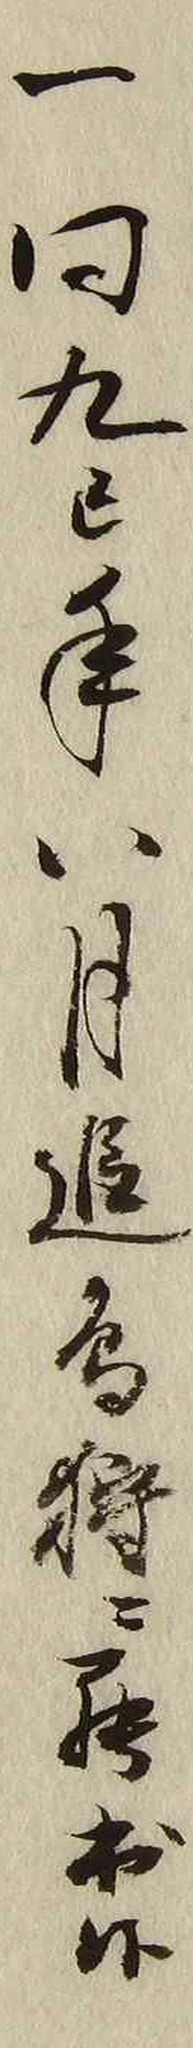一同九巳年八月追鳥狩ニ罷出候
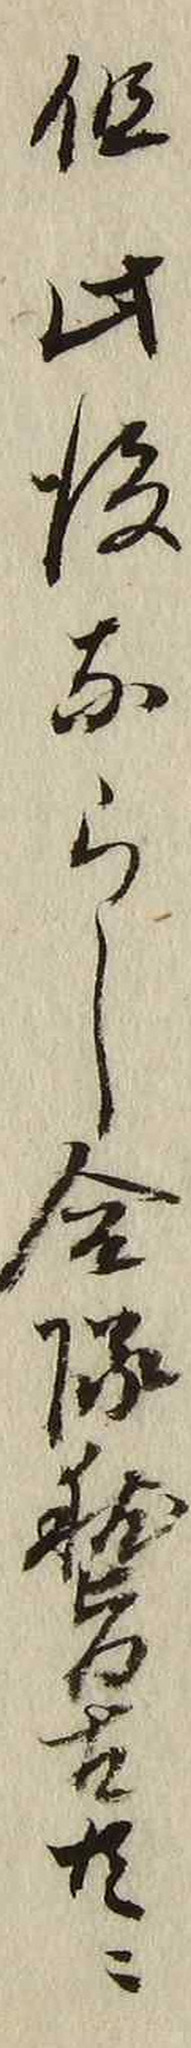但此後ならし合隊稽古共ニ
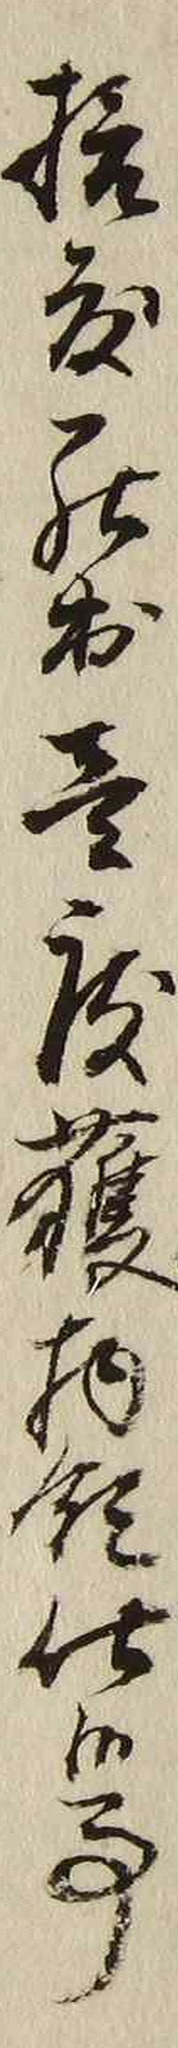拾度罷出壱度獲拝領仕候事
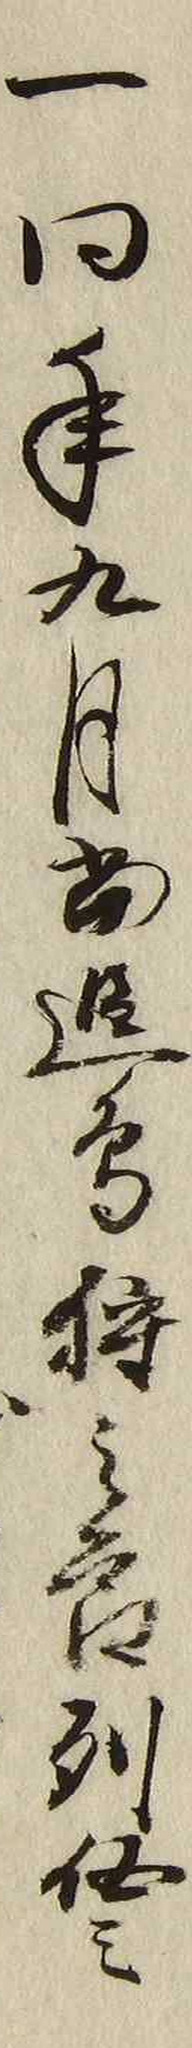一同年九月当追鳥狩之節列伍之
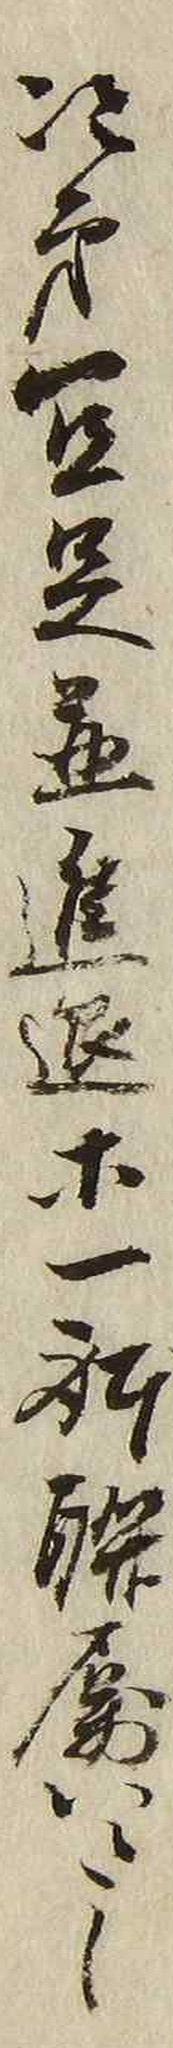次第宜足並進退等一体聯属いたし
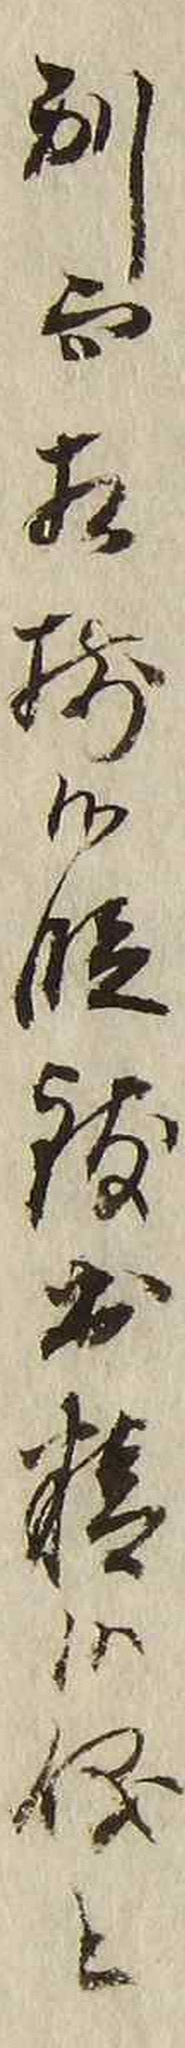別而相揃候段致出精候儀と

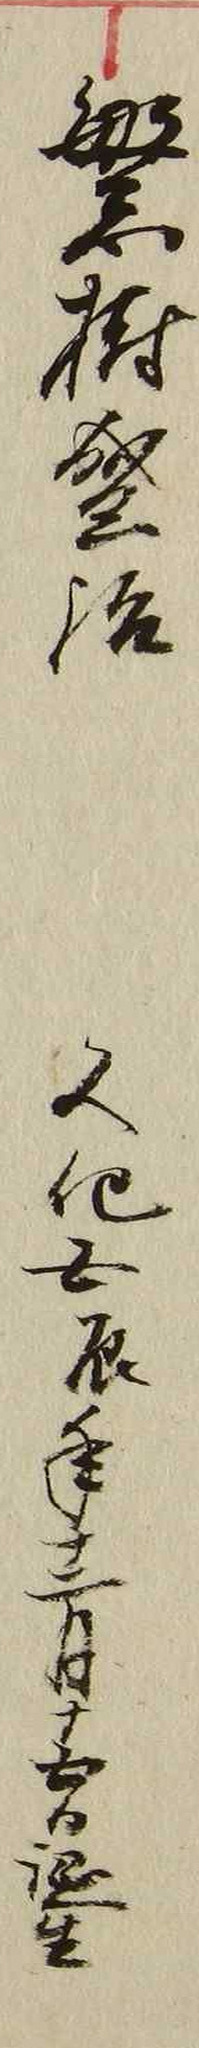繁樹盛治文化五辰年十二月十五日誕生
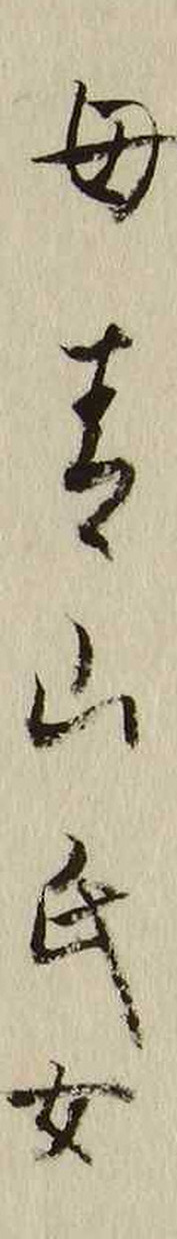母青山氏女
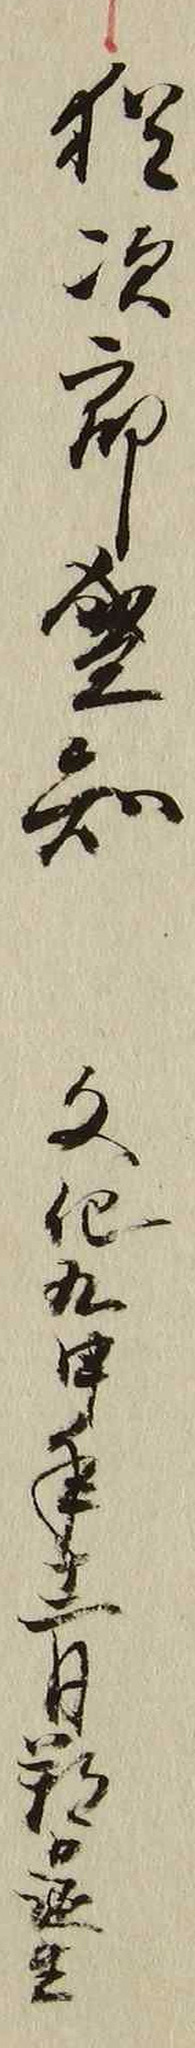猶次郎盛知文化九申年十二月朔日誕生
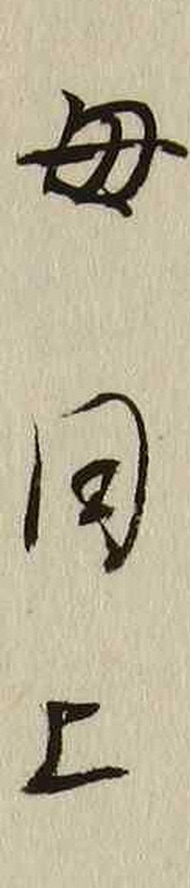母同上

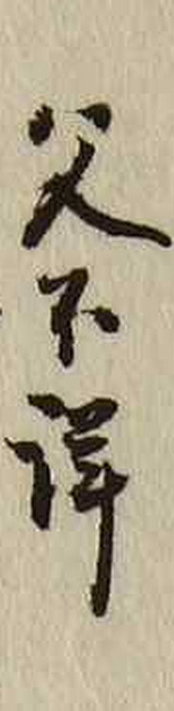父不詳
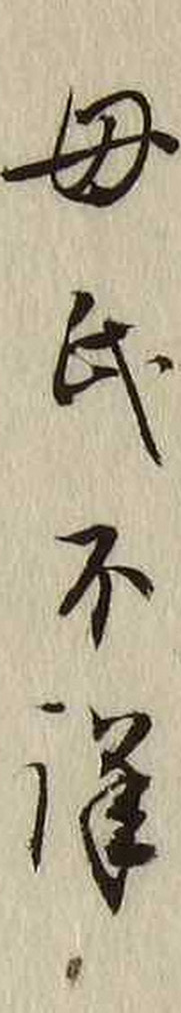母氏不詳
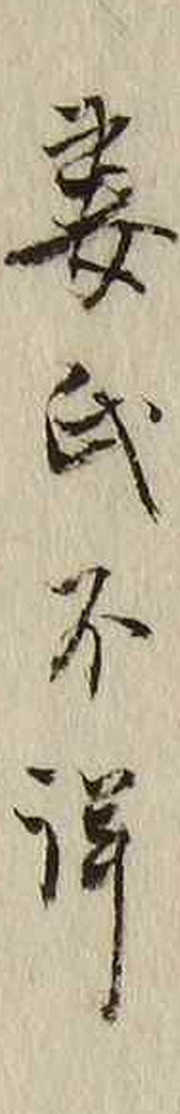妻氏不詳
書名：諸士系譜　巻之349　も之部5
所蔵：会津若松市立会津図書館
